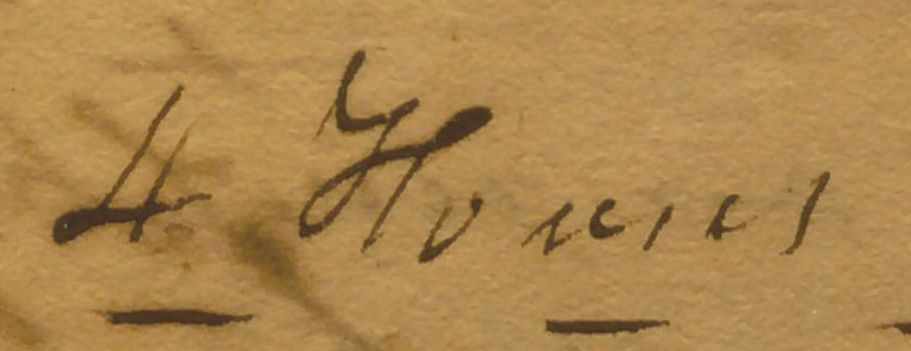4 Houses
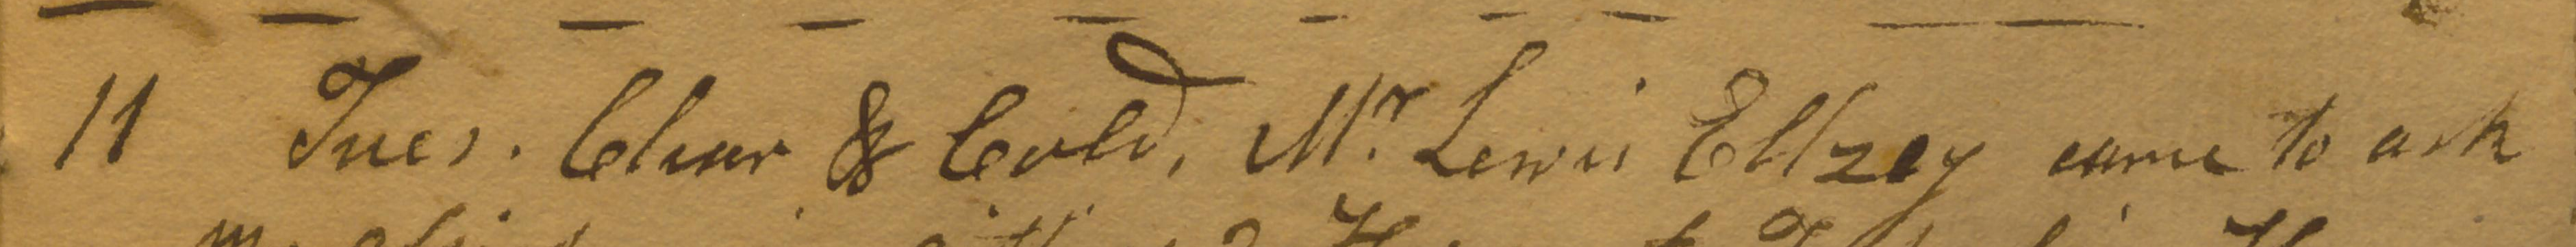11 Tues. Clear & Cold, M^r. Lewis Eltzey came to ask
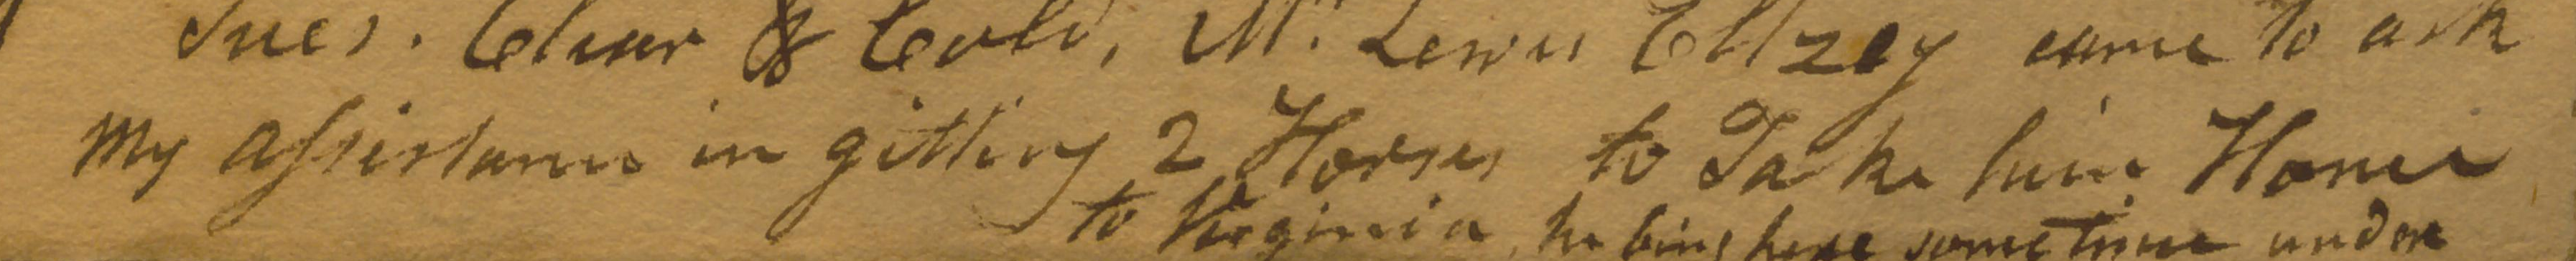My assistance in gitting 2 Horses to Take him Home
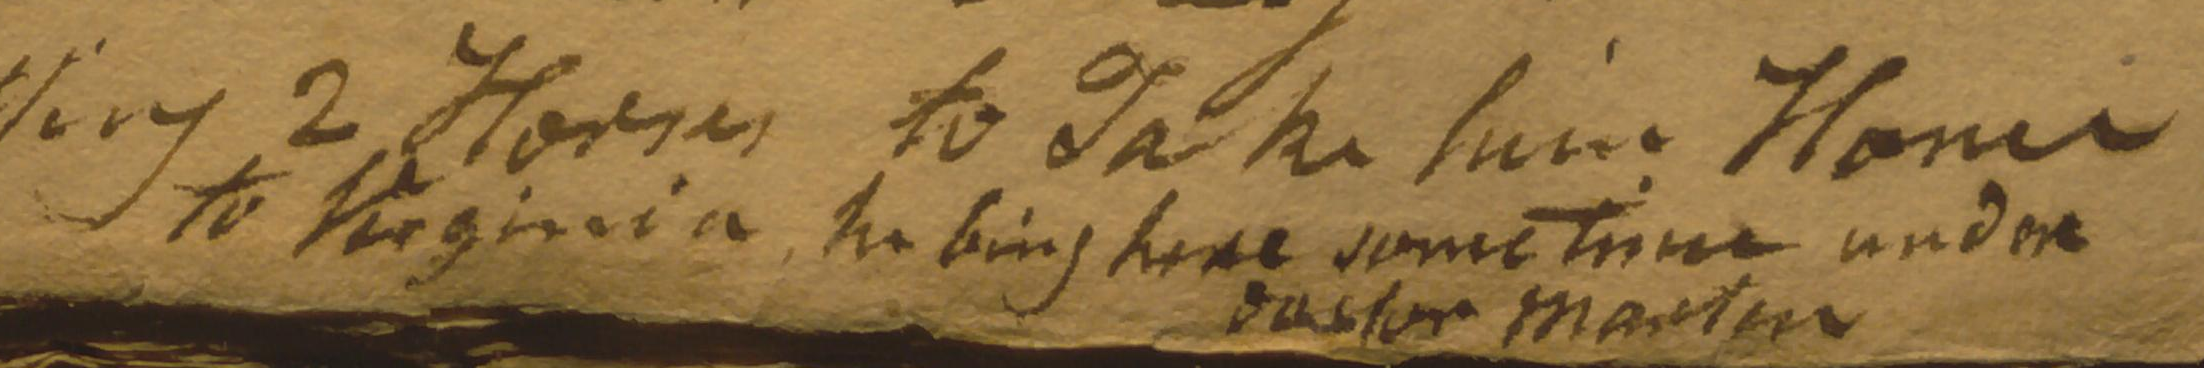to Virginia, he being here some time under
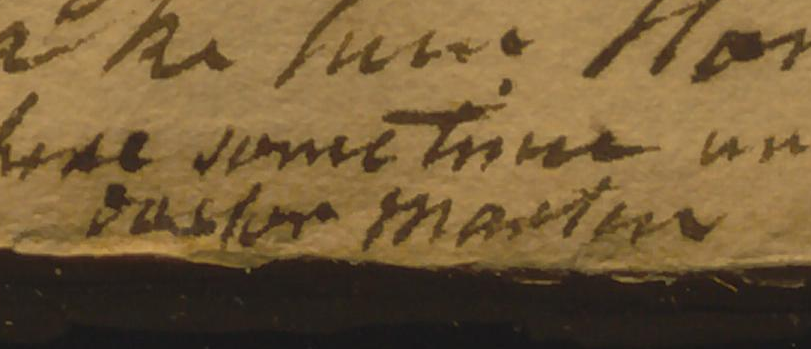dustor Martin
